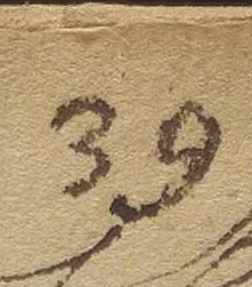39
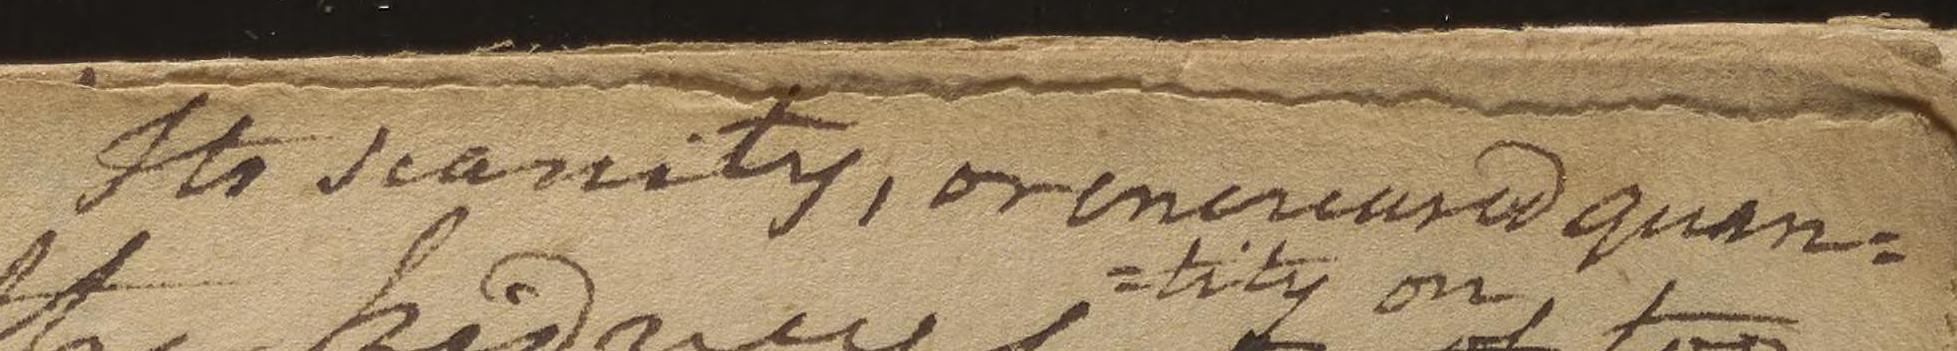Its scarcity, or encreased quan-
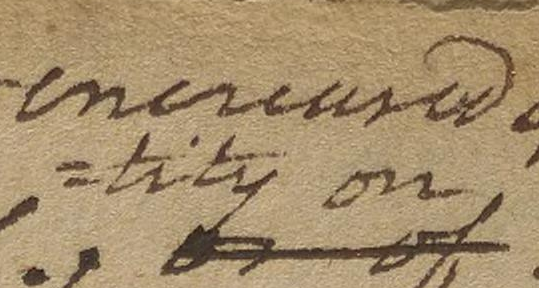-tity on
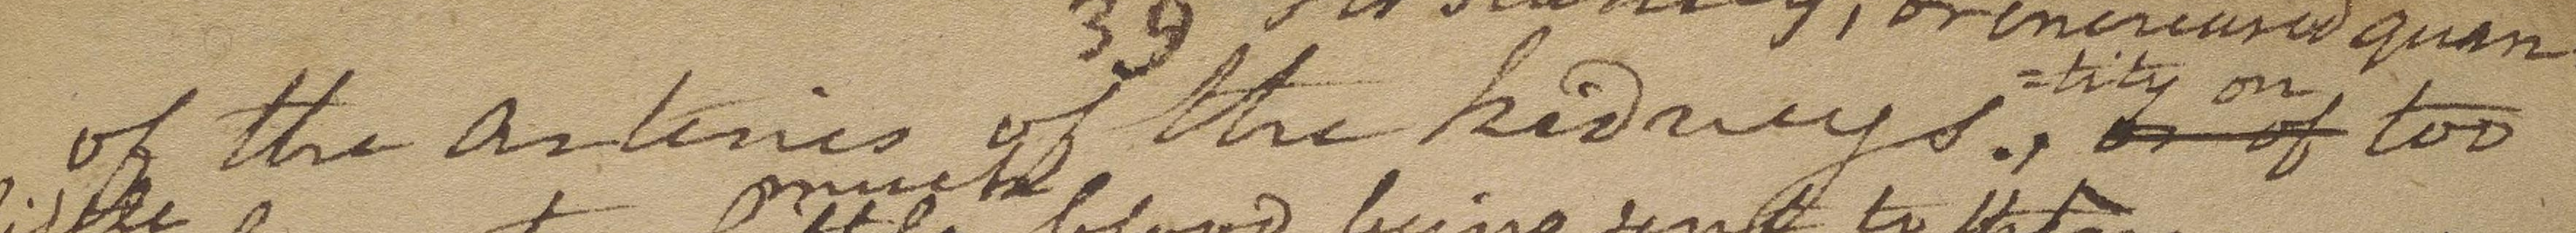of arteries of the kidneys., [or of] too
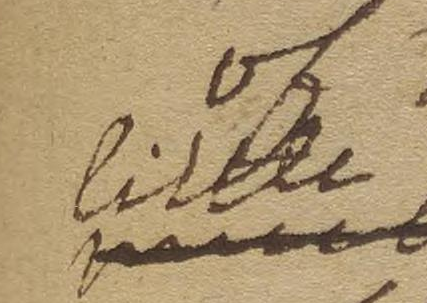little
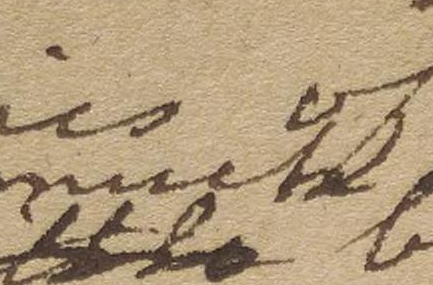much
